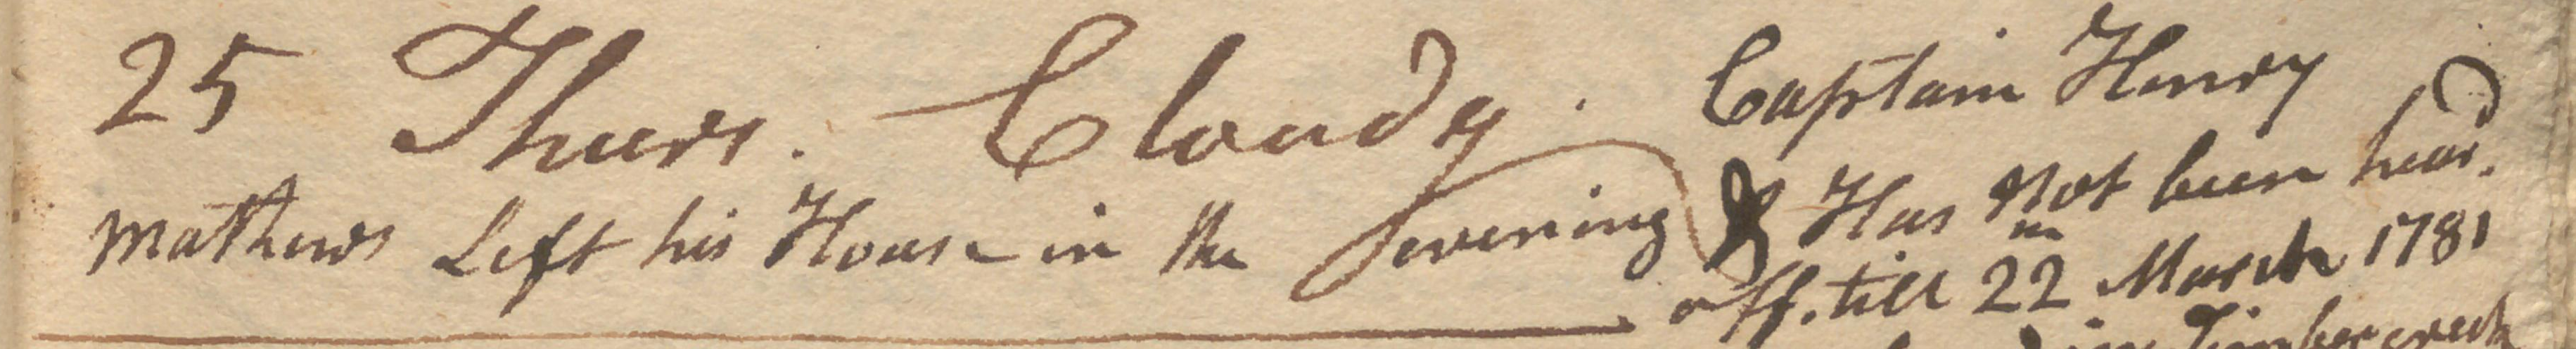mathews Left his House in the evening & Has not been hear^d.
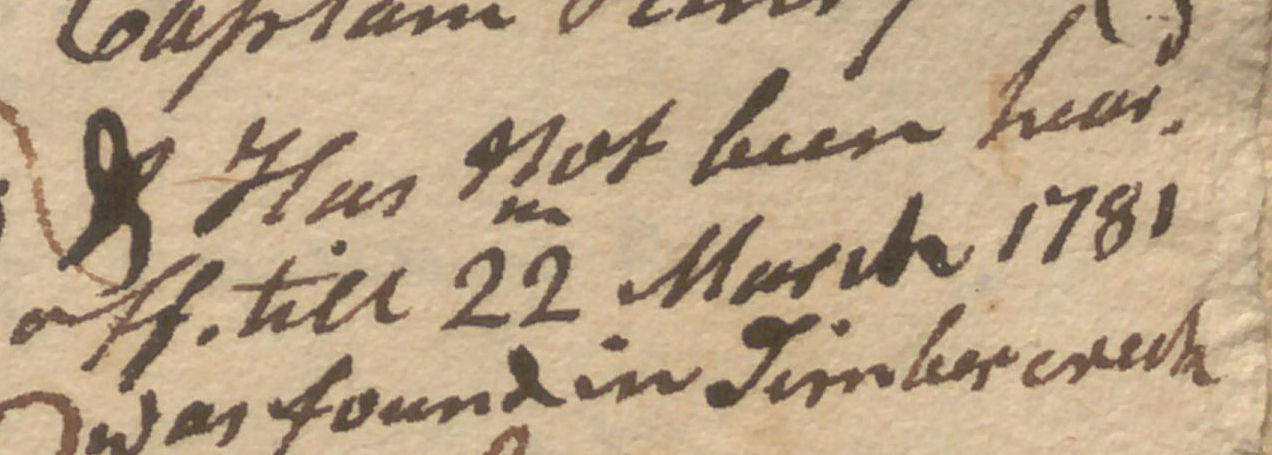off till 22^th March 1781
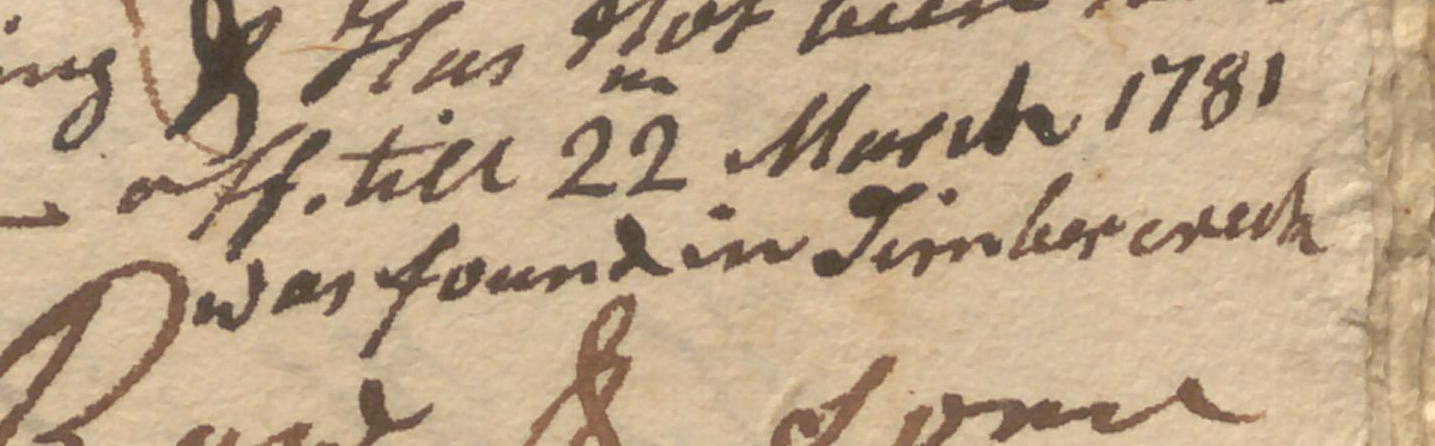was found in Timber creek
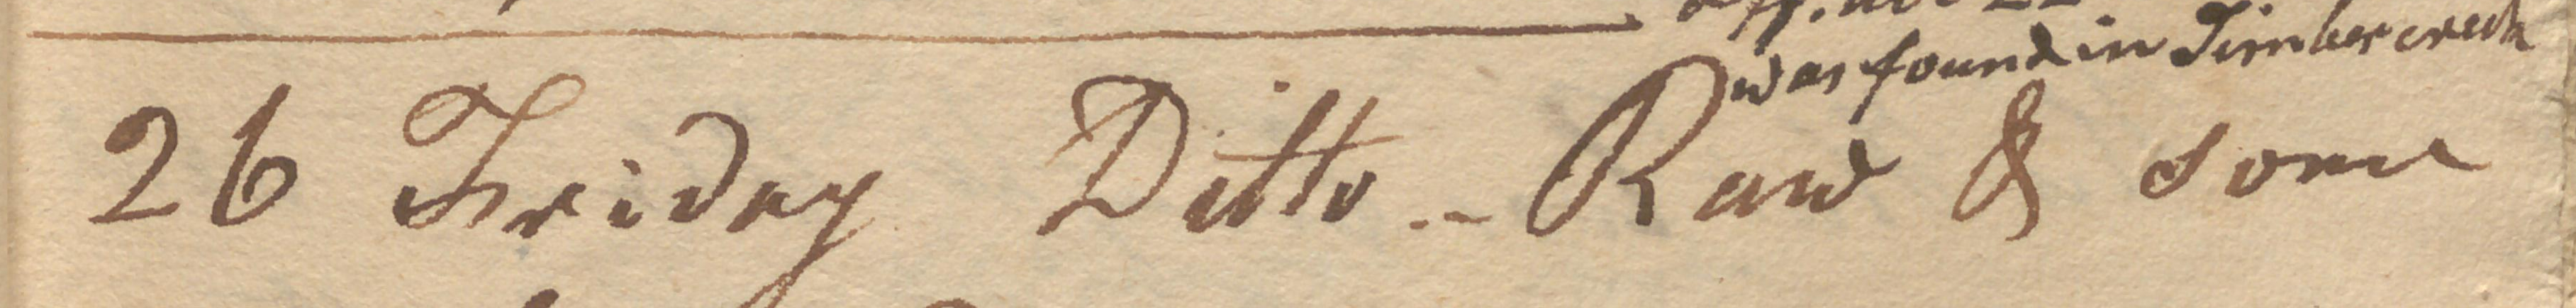26 Friday Ditto- Raw & some
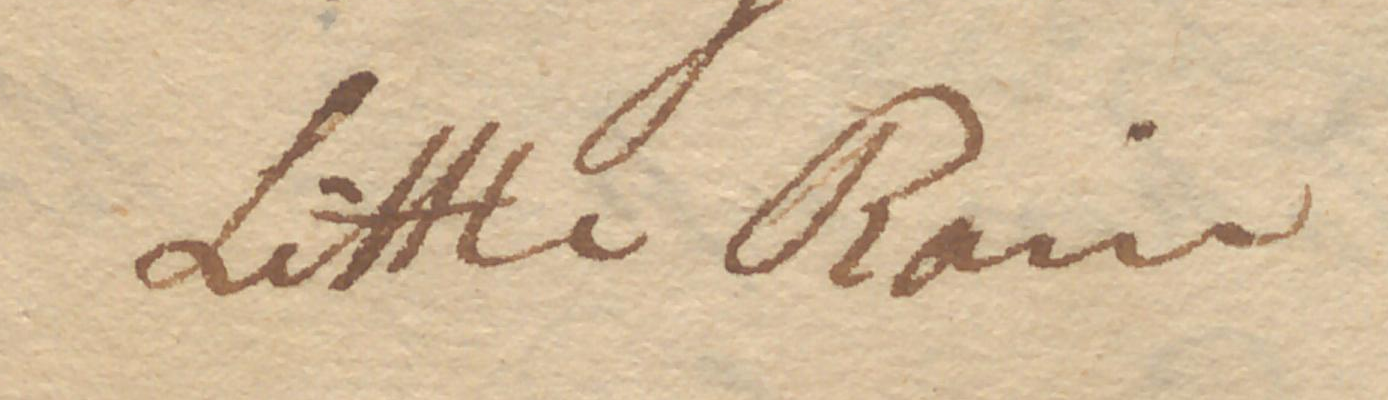Little Rain
